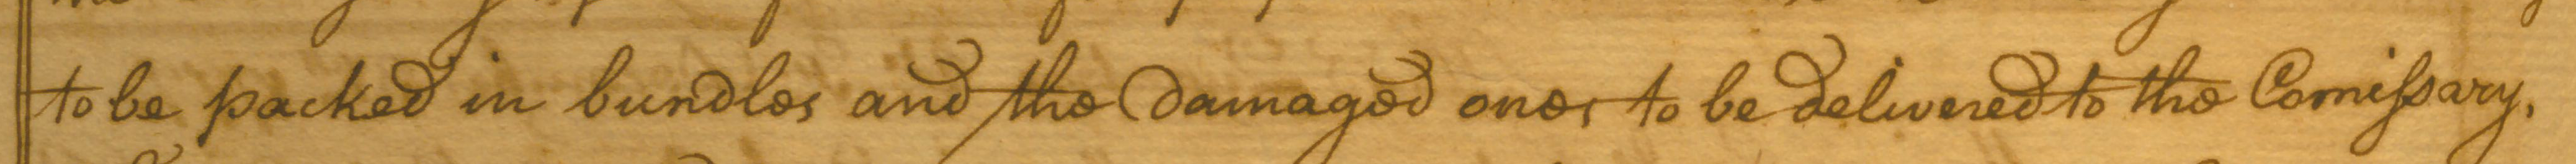to be packed in bundles and the damaged ones to be delivered to the Comissary.
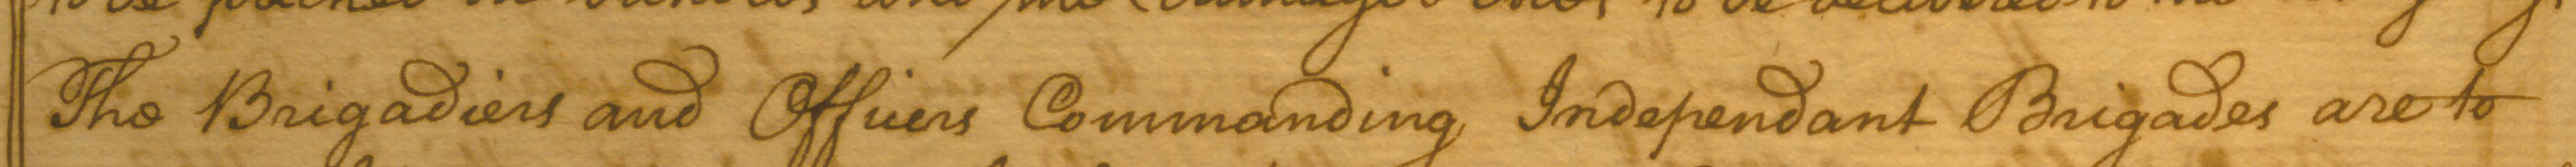The Brigadiers and Officers Commanding Independant Brigades are to
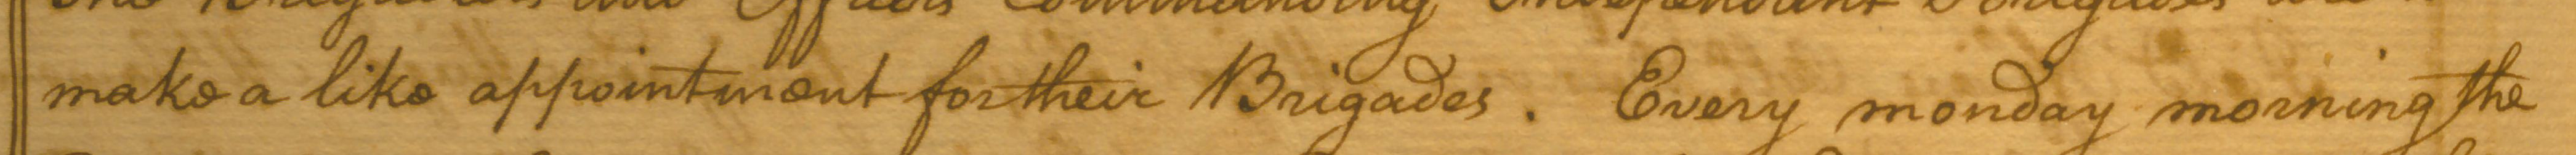make a like appointment for their Brigades. Every monday morning the
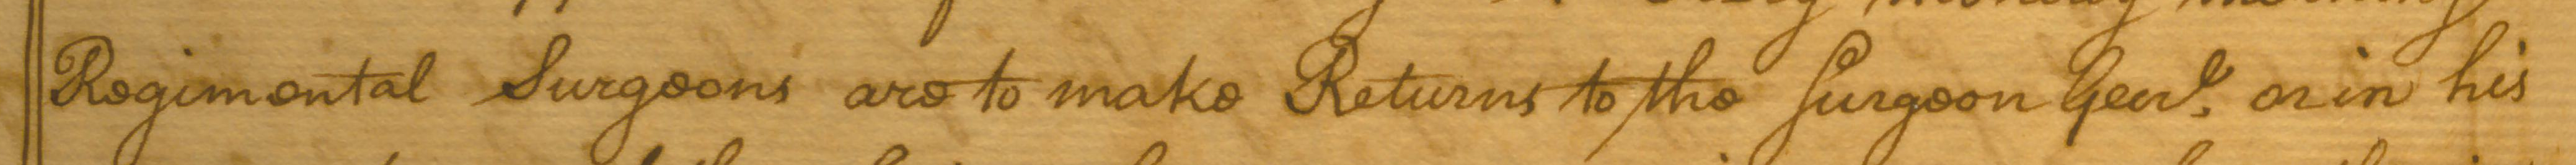Regimental Surgeons are to make Returns to the Surgeon Gen^l. or in his
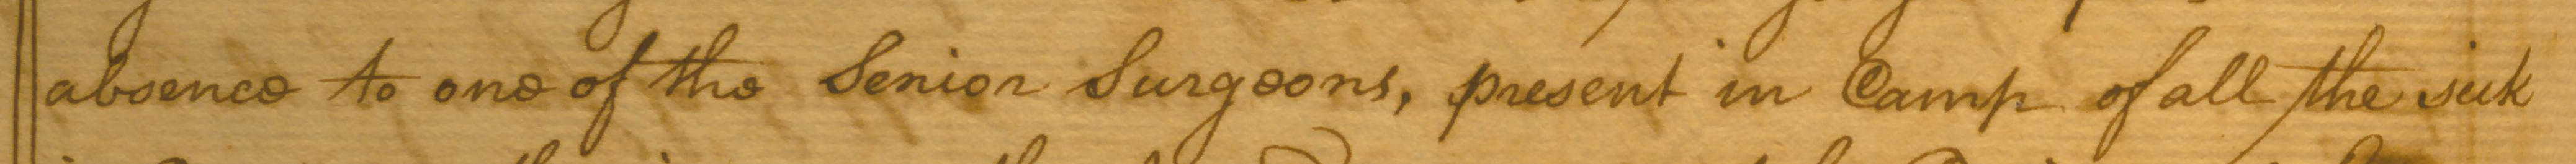absence to one of the Senior Surgeons, present in Camp of all the sick
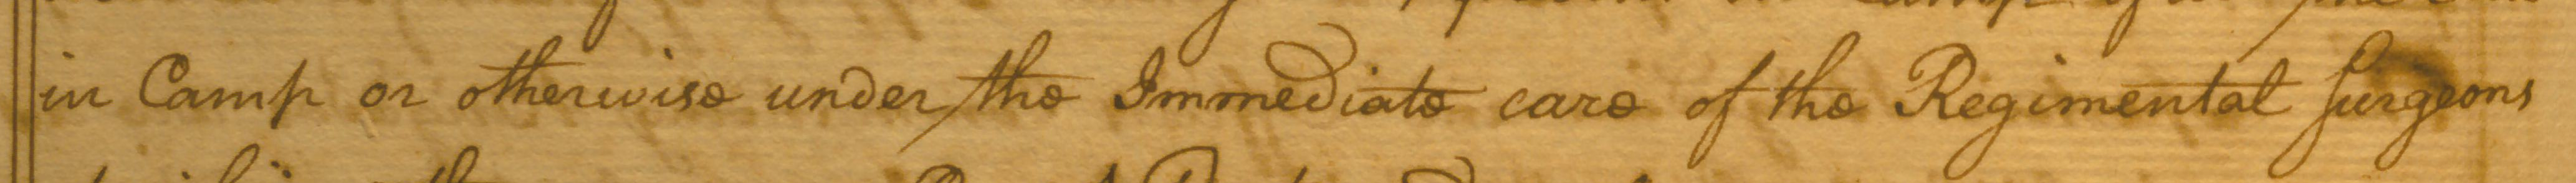in Camp or otherwise under the Immediate care of the Regimental Surgeons
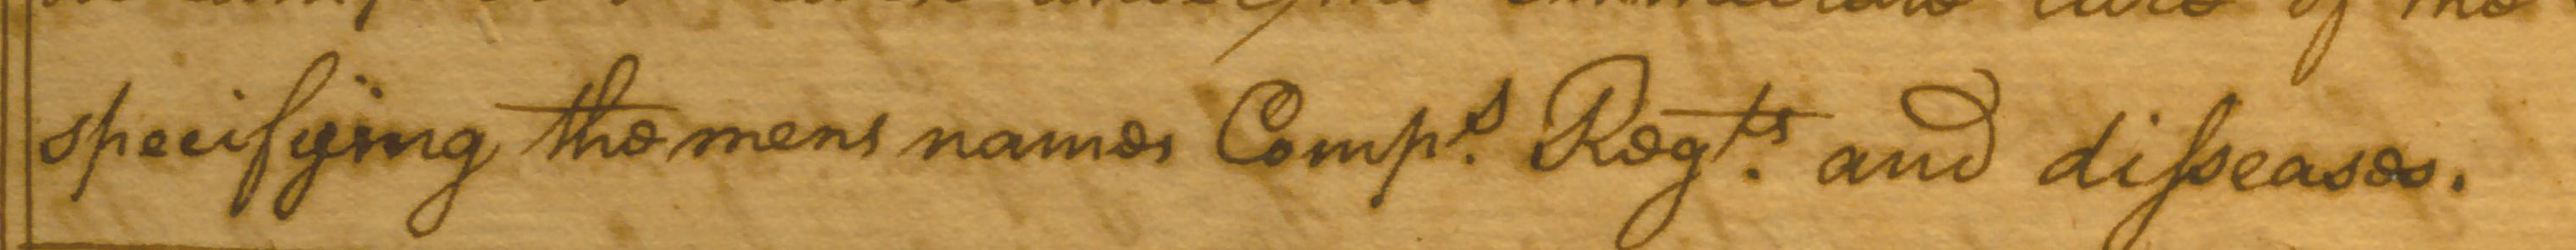specifying the mens names Comp^s. Reg^ts. and disseases.
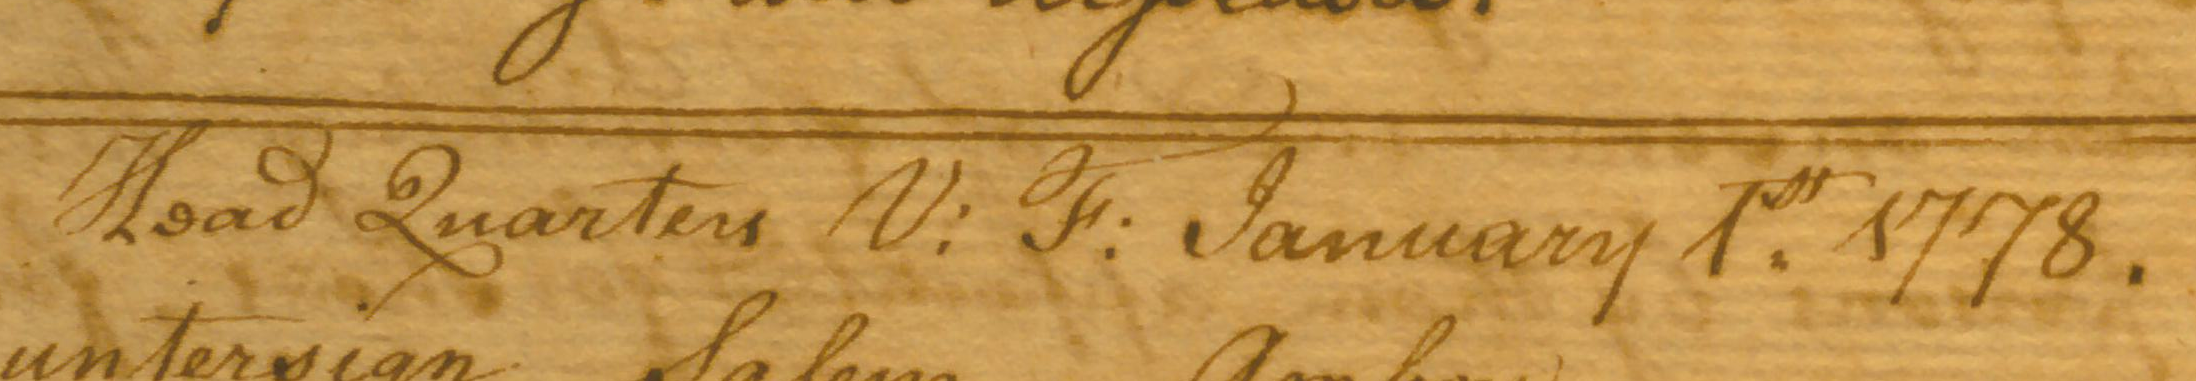Head Quarters V: F: January 1^st. 1778.
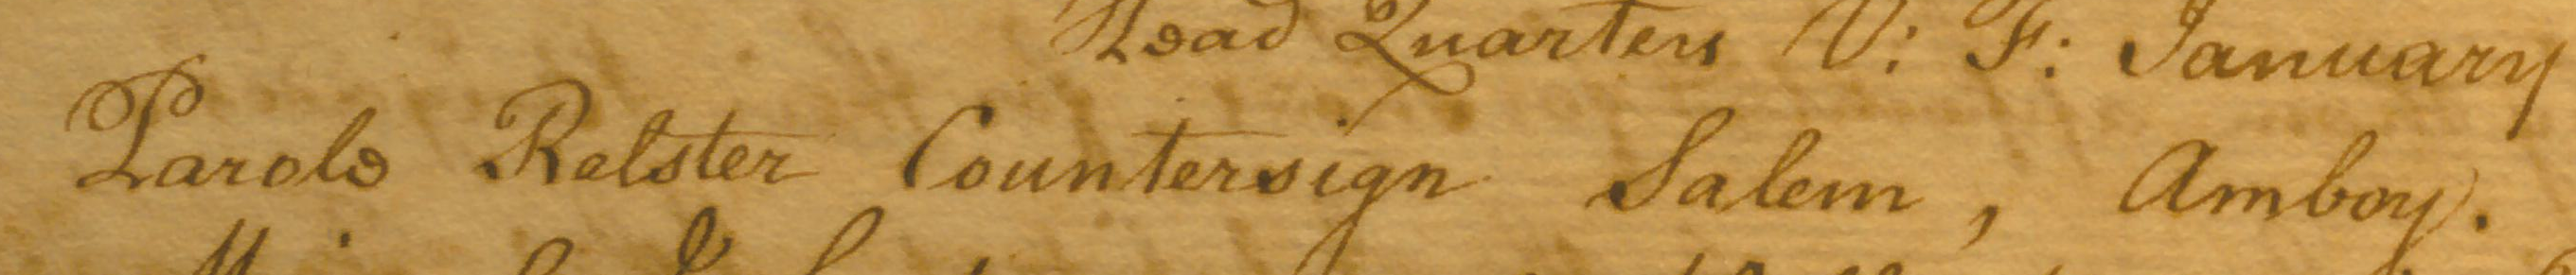Parole Ralster Countersign Salem, Amboy.
